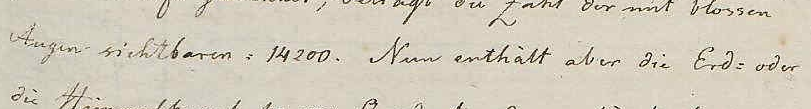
Augen sichtbaren: 14200. Nun enthält aber die Erd- oder
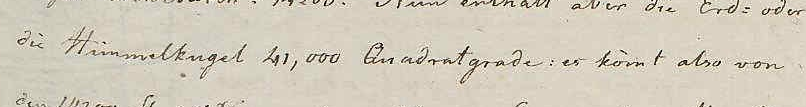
die Himmelkugel 41,000 Quadratgrade: es kömt also von
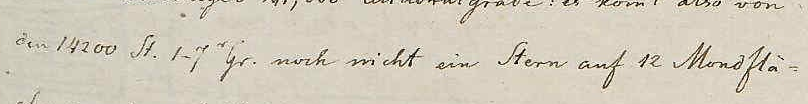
den 14200 St. 1–7￼ Gr. noch nicht ein Stern auf 12 Mondflä-
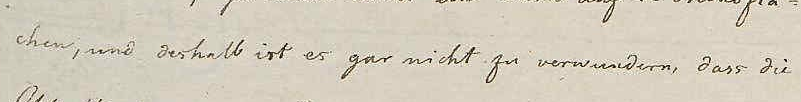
chen, und deshalb ist es gar nicht zu verwundern, dass die
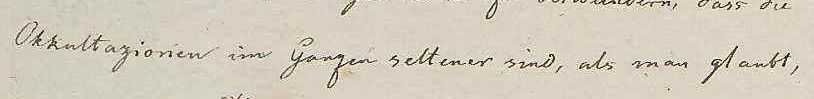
Okkultazionen im Ganzen seltener sind, als man glaubt,
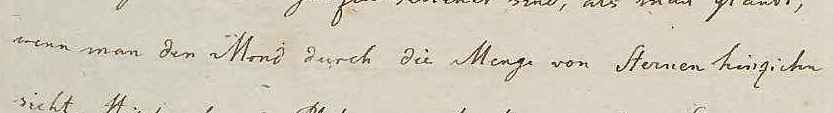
wenn man den Mond durch die Menge von Sternen hinziehn
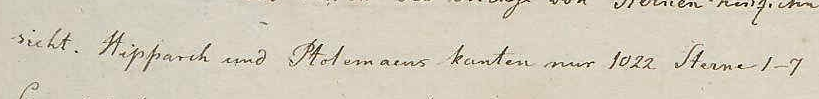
sieht. Hipparch und Ptolemaeus kanten nur 1022 Sterne 1–7
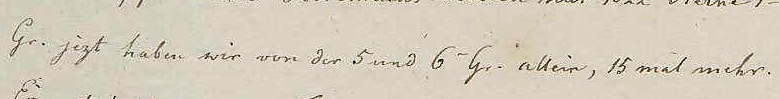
Gr. jezt haben wir von der 5 und 6￼ Gr. allein, 15 mal mehr.
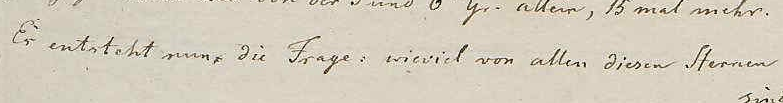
Es entsteht nun, die Frage: wieviel von allen diesen Sternen
